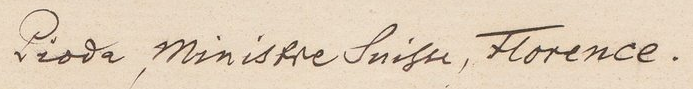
Pioda, Ministre Suisse, Florence.
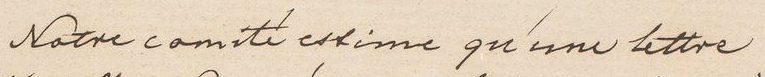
Notre comité estime qu'une lettre
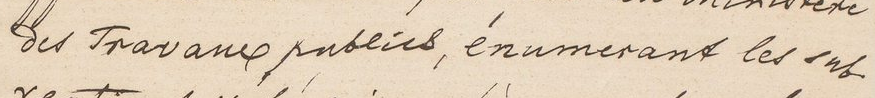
des Travaux publics, énumerant les sub-
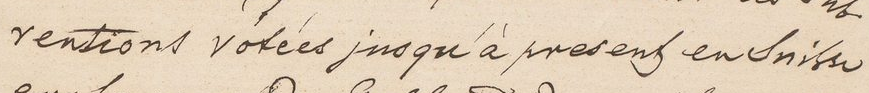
ventions votées jusqu'à present en Suisse
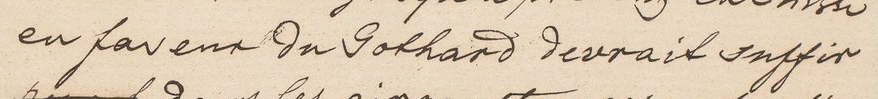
en faveur du Gothard devrait suffir
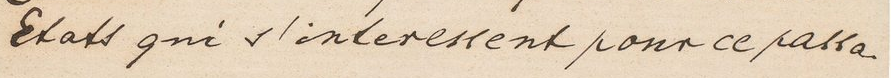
Etats qui s'interessent pour ce passa-
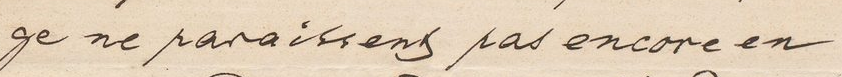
ge ne paraissent pas encore en
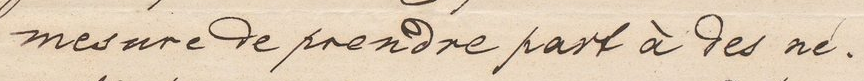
mesure de prendre part à des né-
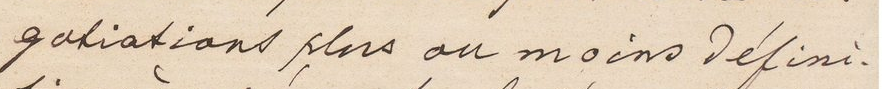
gotiations plus ou moins défini-
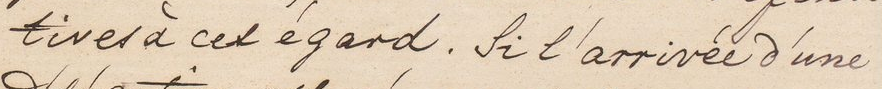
tives à cet égard. Si l'arrivée d'une
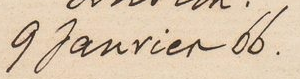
9 Janvier 66.
